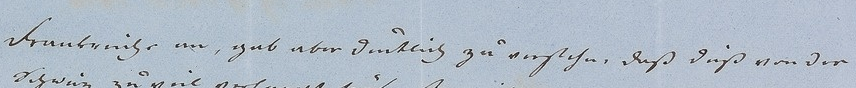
Frankreichs an, gab aber deutlich zu verstehn, daß dieß von der
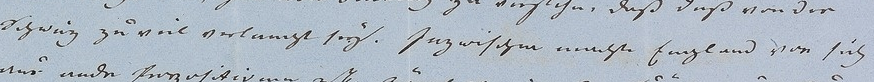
Schweiz zu viel verlangt sey. Inzwischen machte England von sich
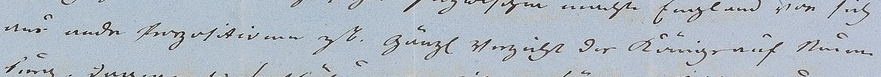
aus andre Propositionen zB. gänzl. Verzicht des Königs auf Neuen-
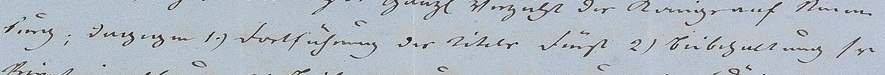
burg; dagegen 1.) Fortsichrung des Titels Fürst 2) Beibehaltung ss
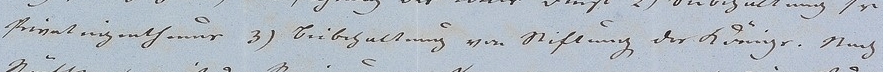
Privateigenthums 3) Beibehaltung von Stiftungen des Königs. Nach
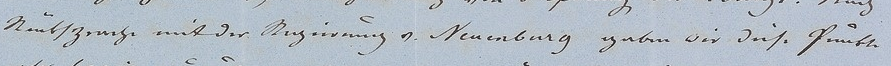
Rücksprache mit der Regierung v. Neuenburg gaben wir diese Punkte
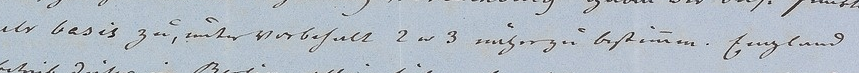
als basis zu, unter vorbehalt 2 u 3 näher zu bestimmen. England
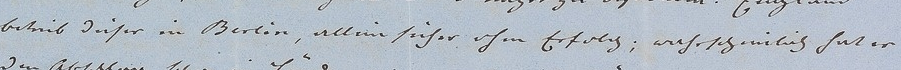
betrieb dieses in Berlin, allein sicher ohne Erfolg; wahrscheinlich hat es
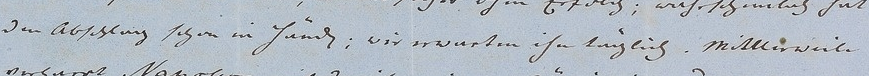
den Abschlag schon in Händen: wir erwarten ihn täglich. Mittlerweile
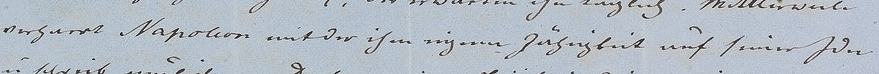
verharrt Napoleon mit der ihm eignen Zähigkeit auf seiner Idee
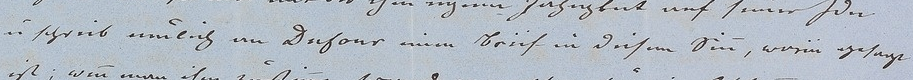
u schrieb neulich an Dufour einen Brief in diesem Sinn, worin gesagt
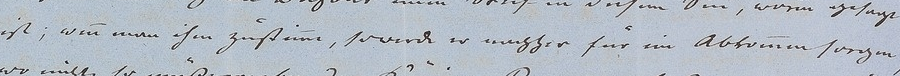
ist; wenn man ihm zustimme, so werde er nachher für ein Abkommen sorgen;
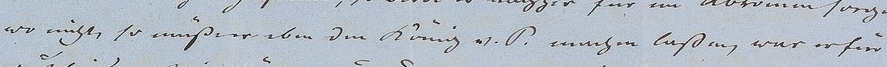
wo nicht, so müße er eben den König v. P. machen laßen, was er für
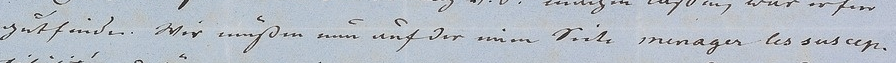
gut finde. Wir müßen nun auf der einen Seite menager les suscep -
